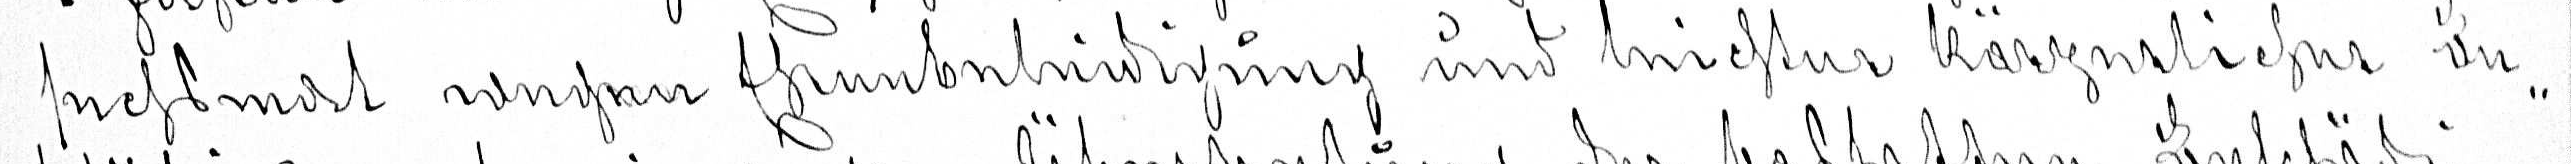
sechsmal wegen Ehrenbeleidigung und leichter körperlicher Be¬
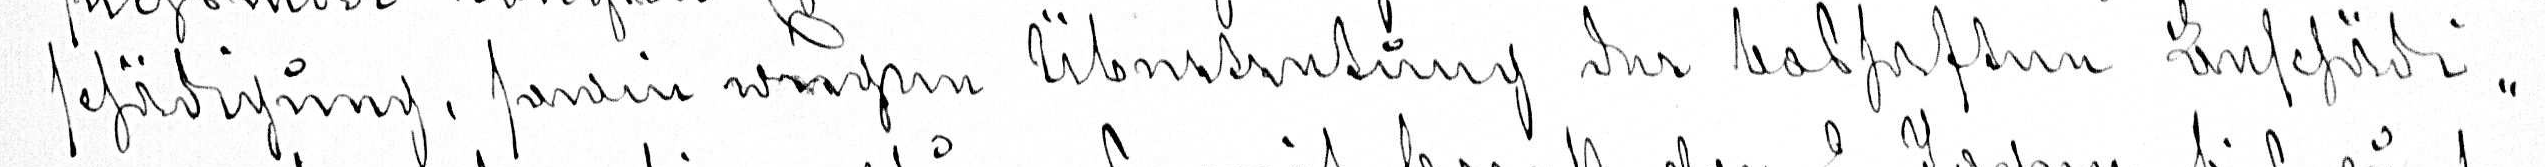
schädigung, sowie wegen Übertretung des boshaften Beschädi¬
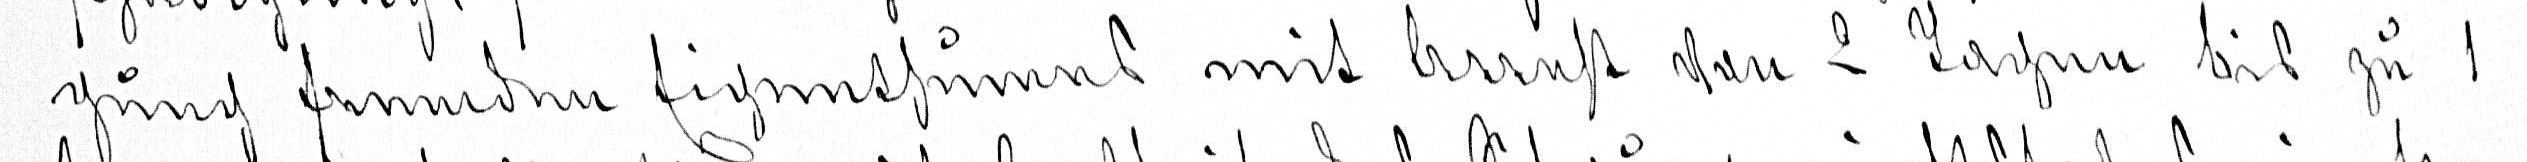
gung fremend Eigenthumes it Arrest von 2 Tagen bis zu 1
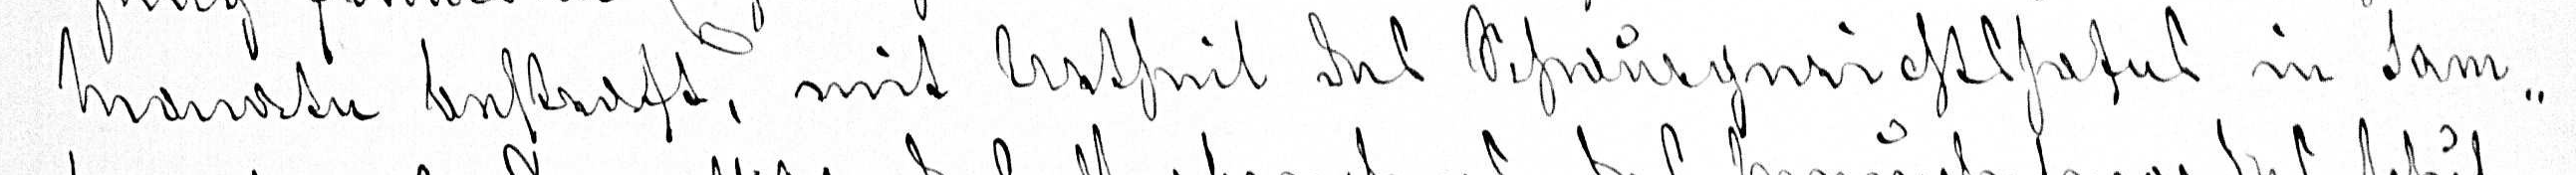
Monate bestraft, mit Urtheil des Schwurgerichtshofes in Sam¬
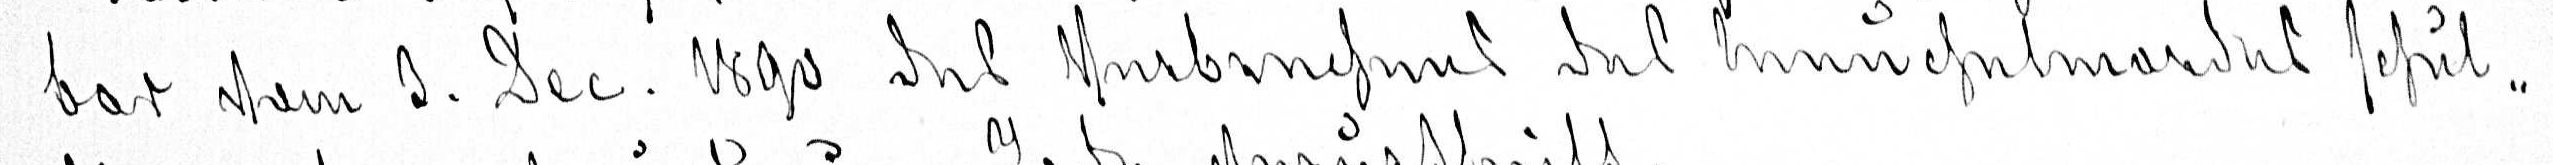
bor vom 3. Dec 1890 des Verbrechens des Meuchelmordes schul¬
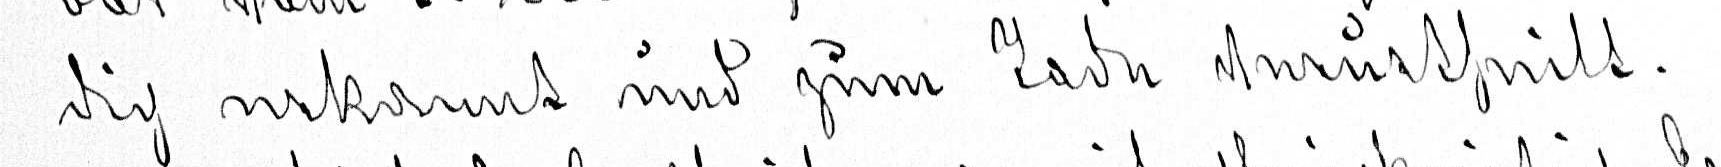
dig erkannt und zum Tode verurtheilt.
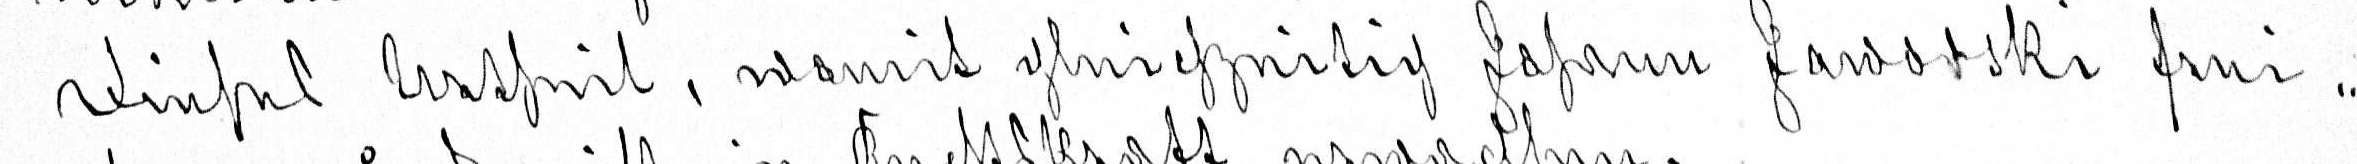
Dieses Urtheil, womit gleichzeitig Johann Jaworski frei¬
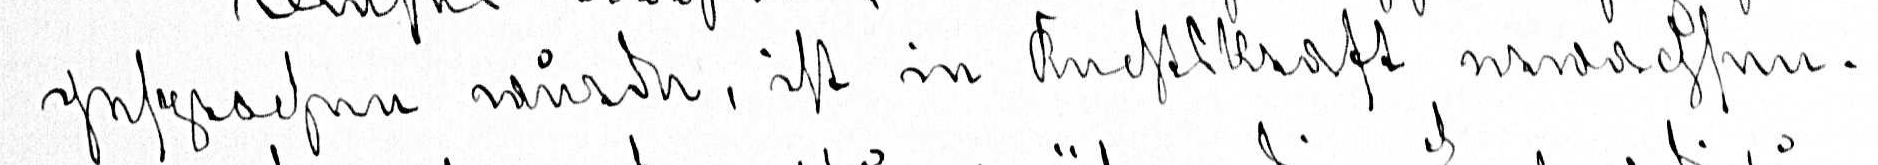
gesprochen wurde, ist in Rechtskraft erwachsen.
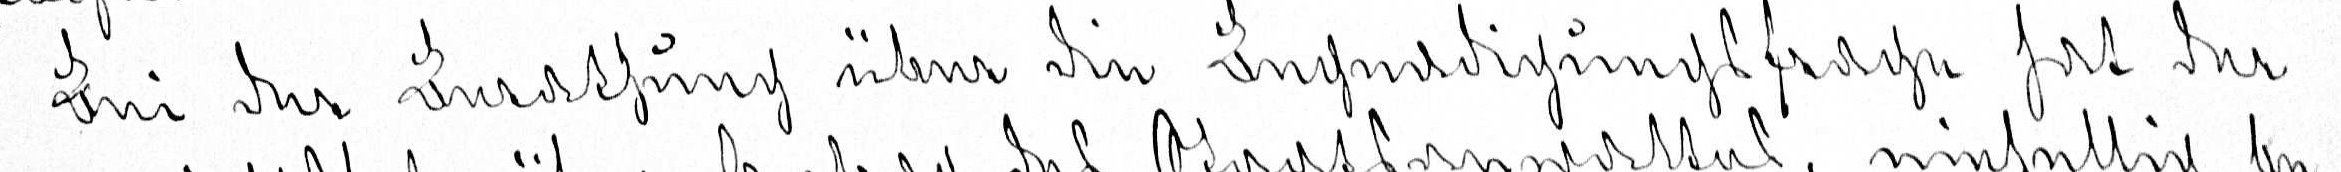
Bei der Berathung über die Begnadigungsfrage hat der
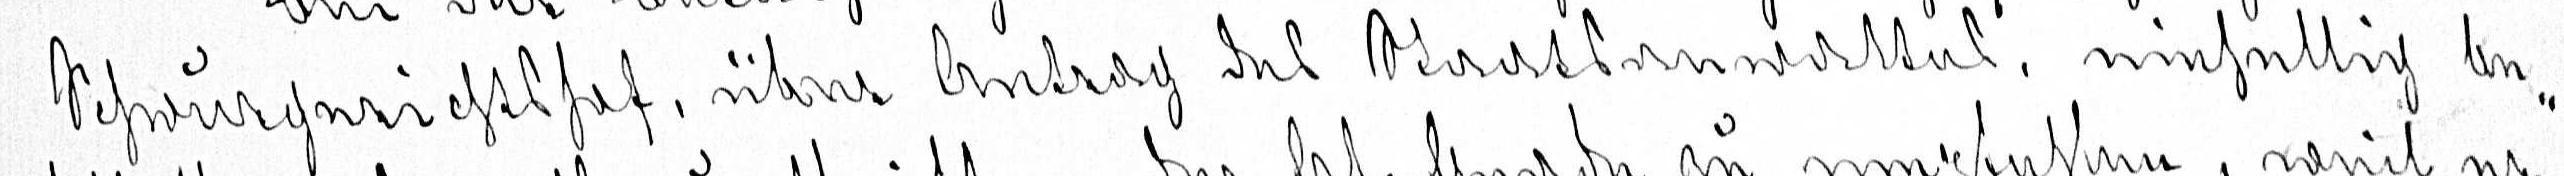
Schwurgerichtshof, über Antrag des Staatsanwaltes, einhellig be¬
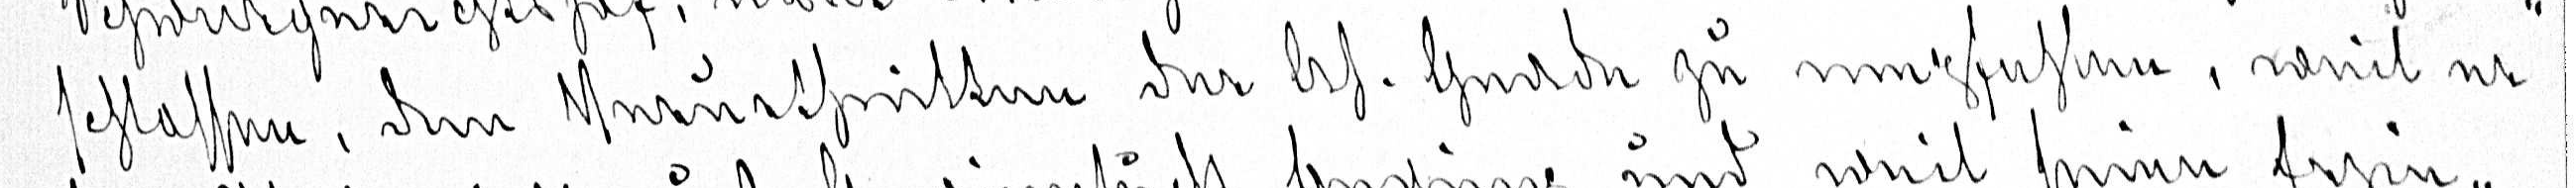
schlossen, der Verurtheilten der Ah. Gnade zu empfehlen, weil es
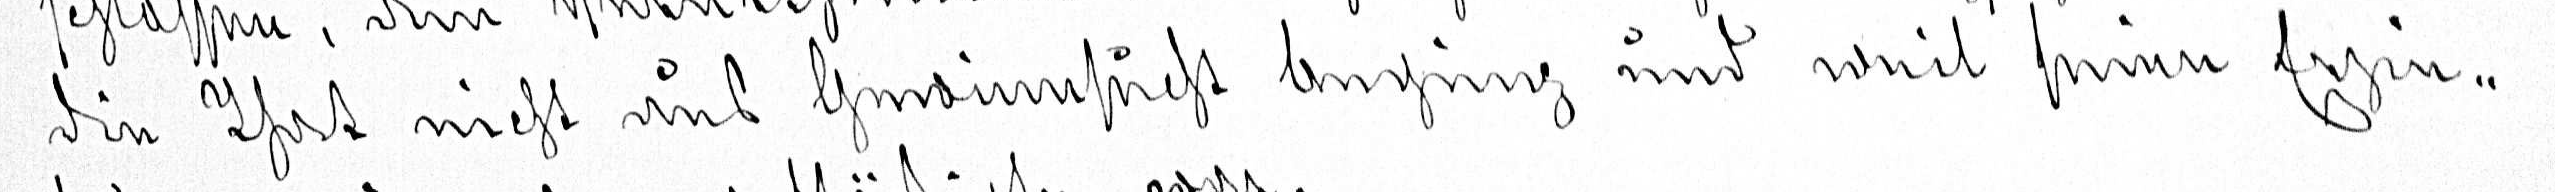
die That nicht aus Gewinnsucht beging und weil seine Erzie¬
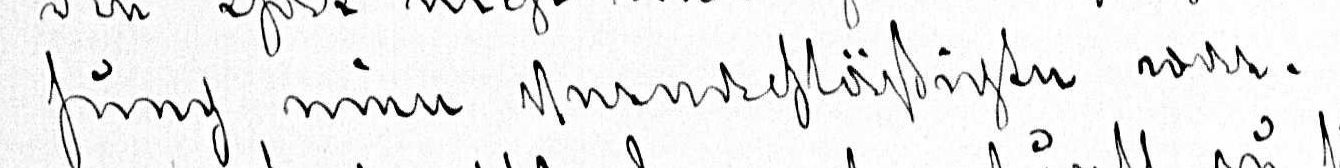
hung eine vernachläßigte war.
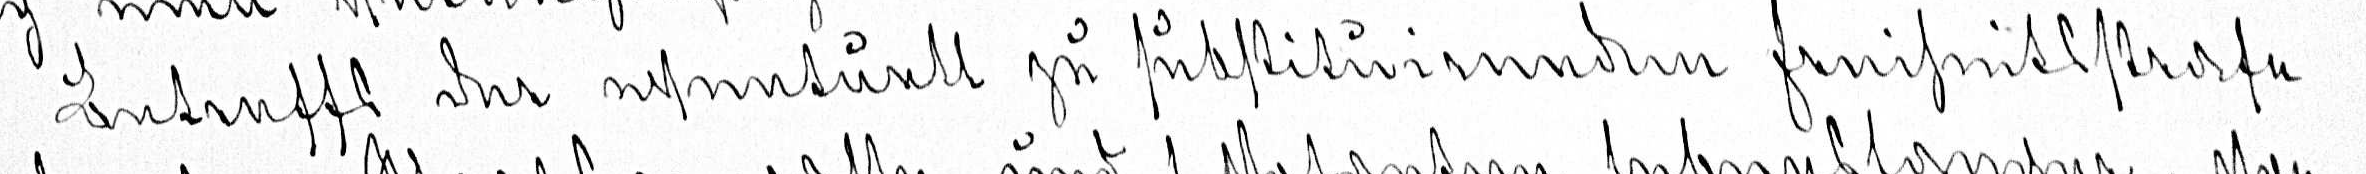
Betrefft der eventuell zu substituirenden Freiheitsstrafe
